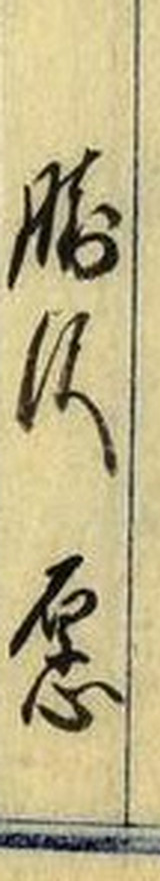勝沢愿
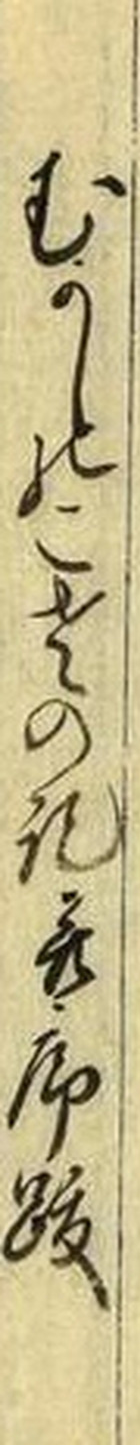むかしのこさの記并序跋
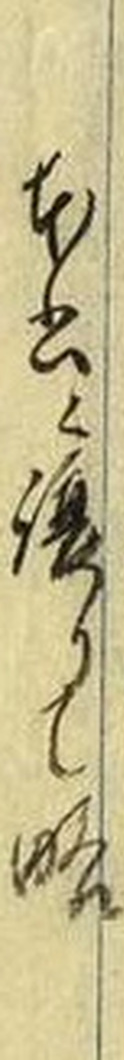本書に譲りて略
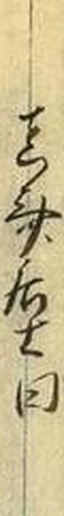真斎居士曰
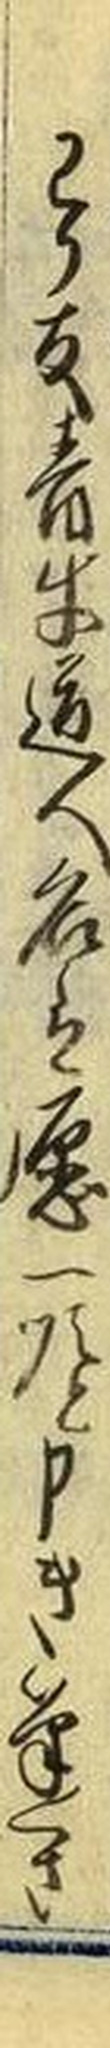わか友青互道人名は愿一順と申き筆くさ
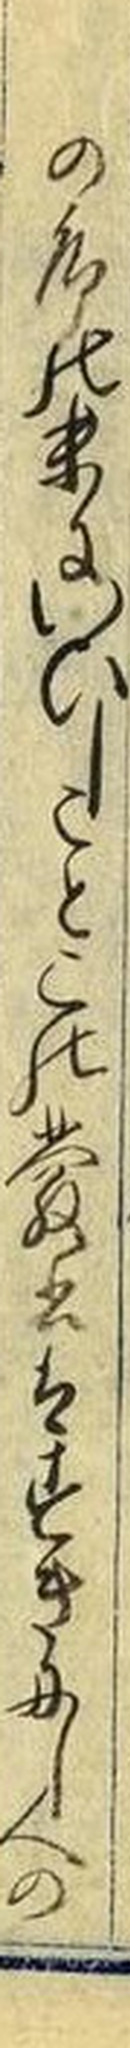の序の末にいひしことこの叢書はすきにし人の
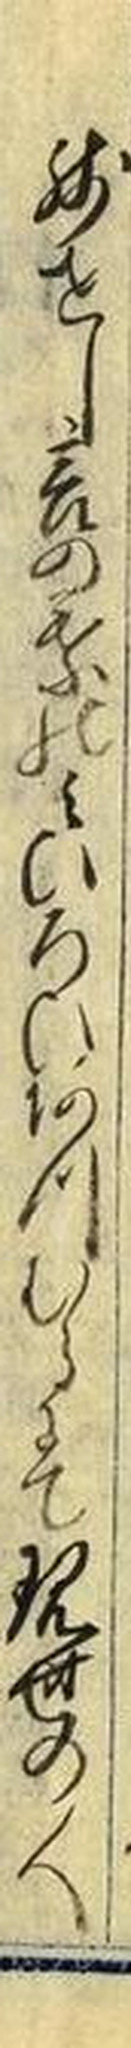残せし言の葉のみひろひあつむるにて現世の人
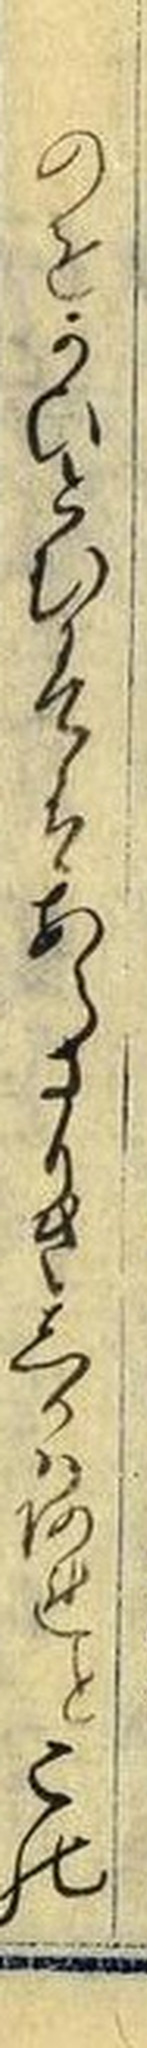のをかひとむにてはあらさりきしかはあれとこの
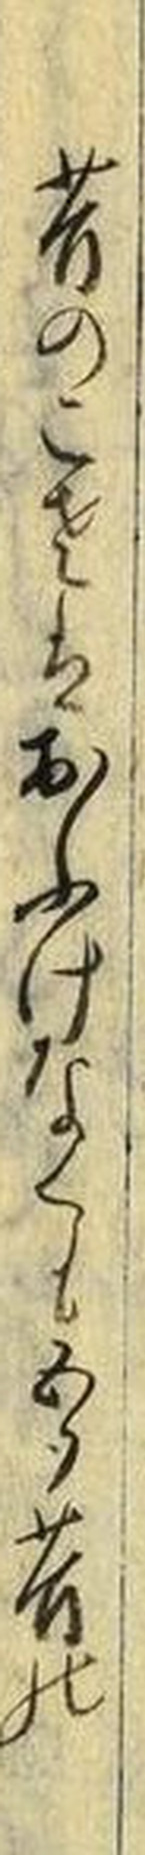昔のこさはおふけなくも五つ昔の
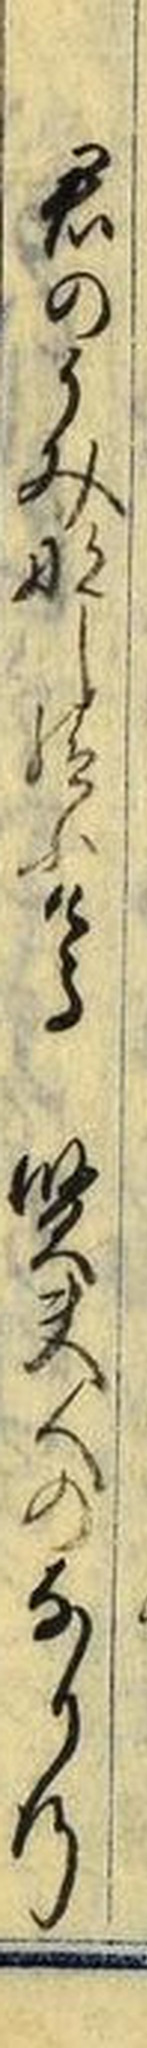君のうみなし給ふける賢夫人のなり行

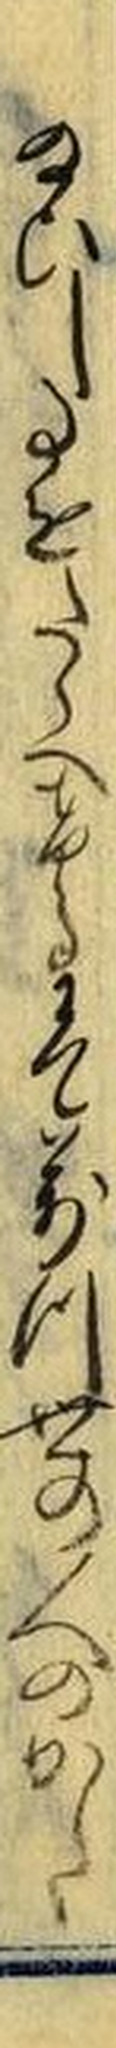給ひし事をたゝへけるにて万つ世の人のかた
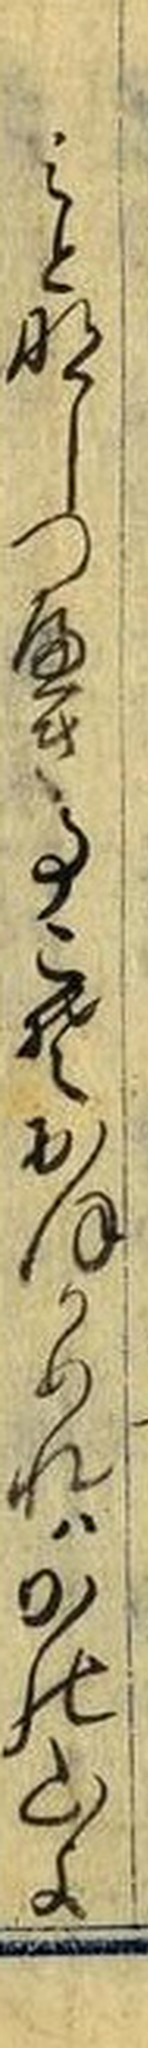みとなしつへき事こそおほかめれはかの山に
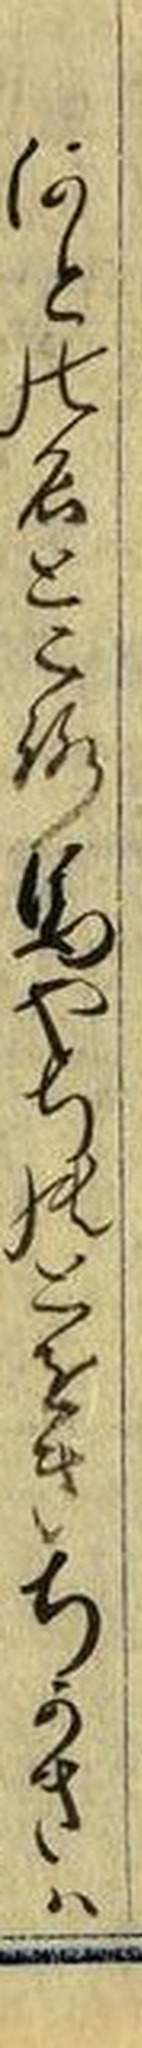何との名ところ馬やちのとをきちかきは
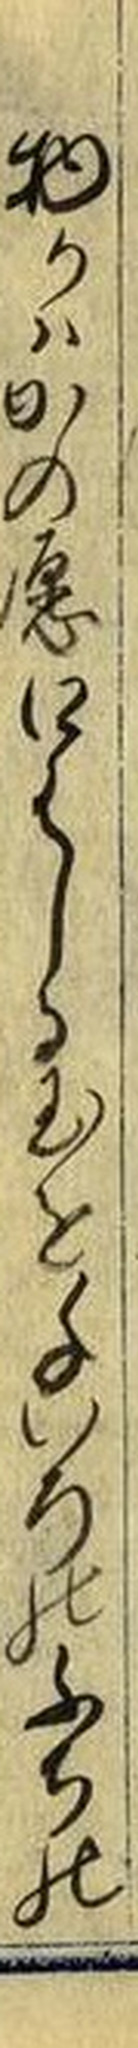物かはかの愿口はしる玉を千いろのふちの
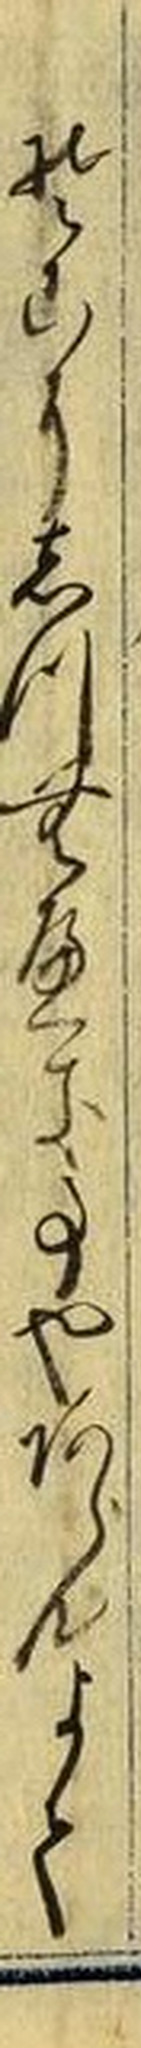そこにしつむへき事やあらんによと
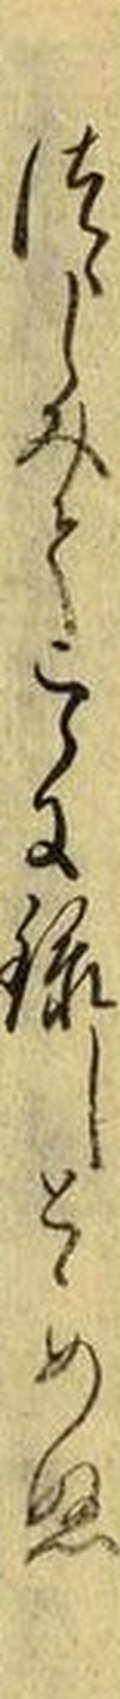つゝしみてこゝに録しとゝめぬ
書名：温古集 三巻
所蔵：福井県文書館 Fukui Prefectural Archives
